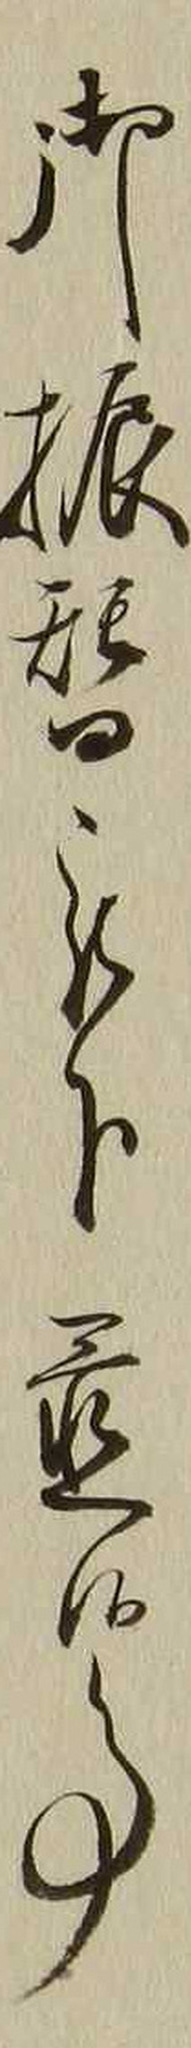御振替被下置候事
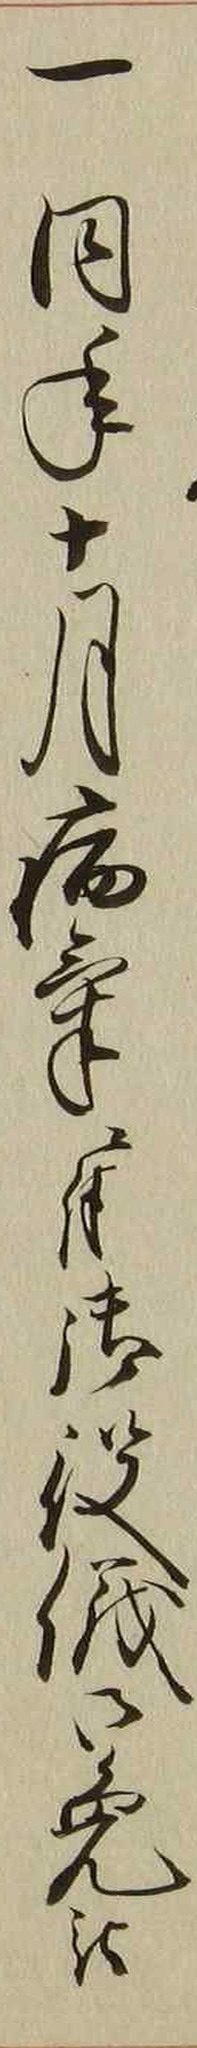一同年十月病気に付御役儀御免被
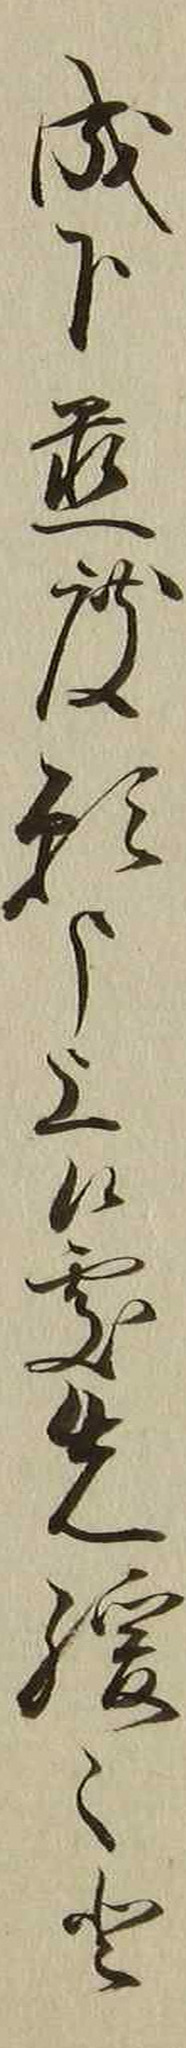成下置度願申上候処先緩々と
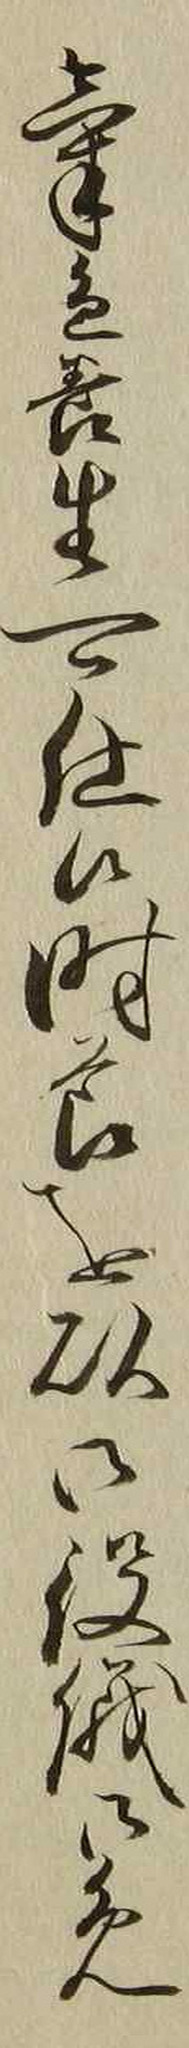気色養生可仕候時節を以御役儀御免
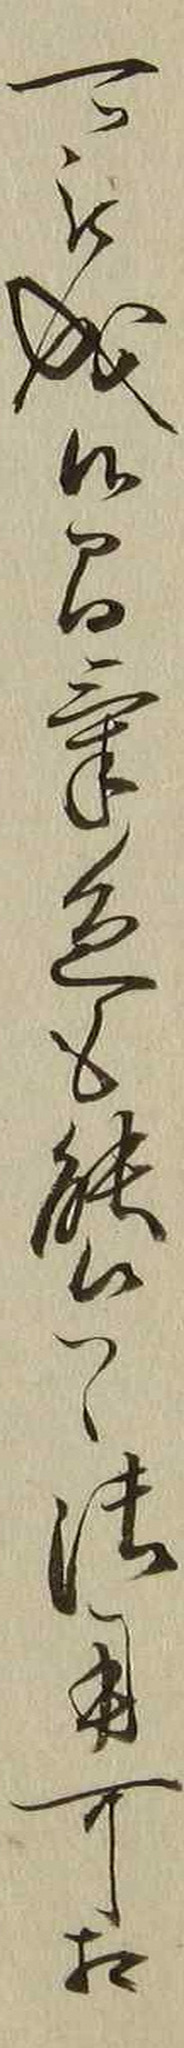可被成候間気色も能候はゝ御用可相
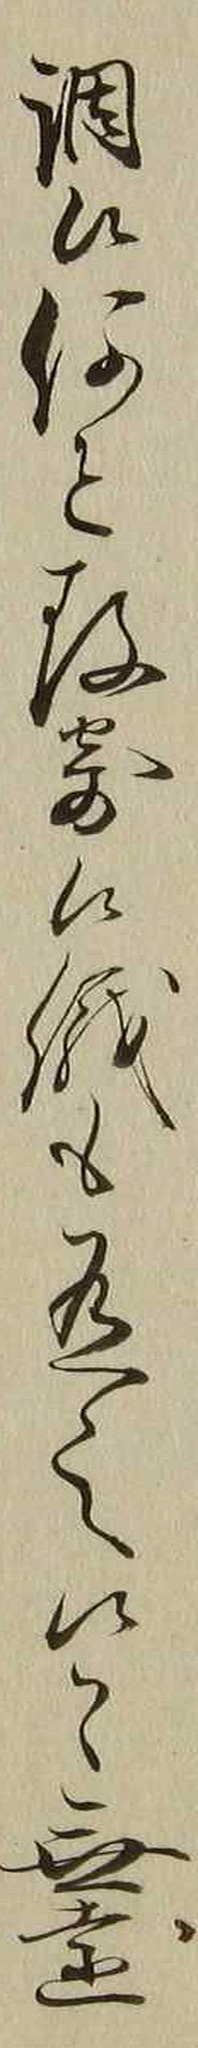調候何と存寄候儀も有之候はゝ無遠
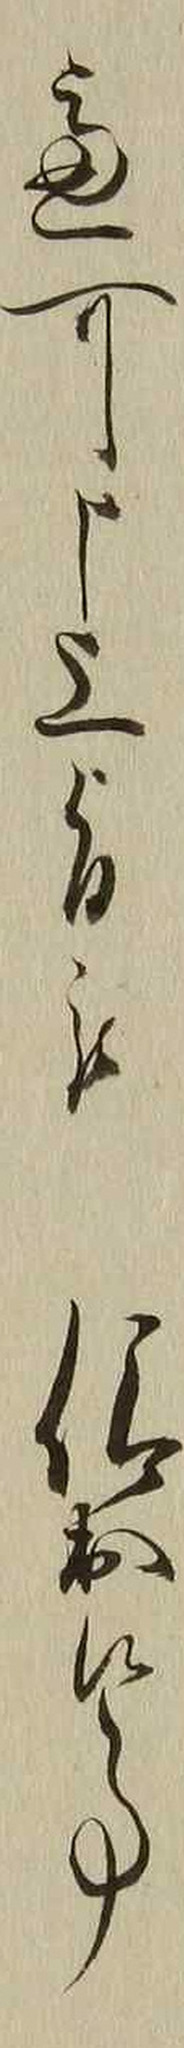慮可申上旨被仰出候事
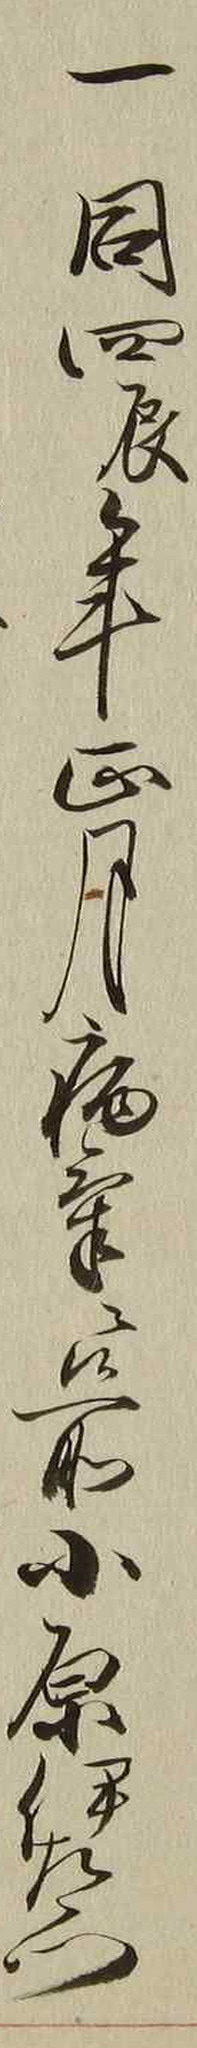一同四辰年正月病気に候所小原伊左衛門
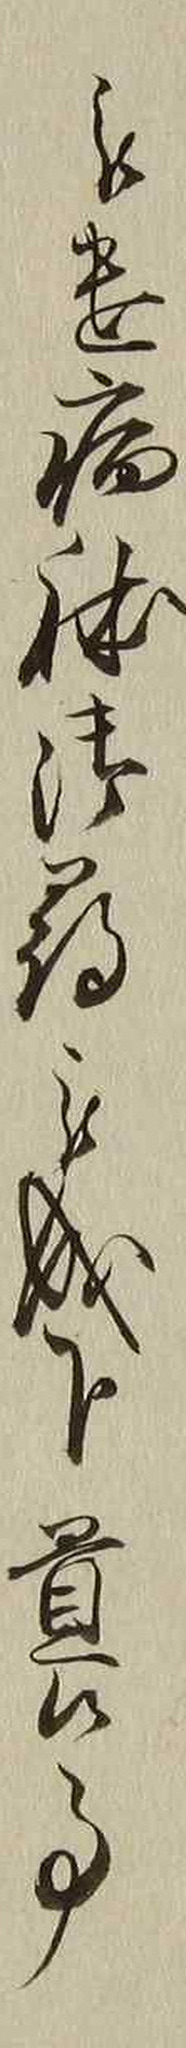被遣病体御尋被成下置候事
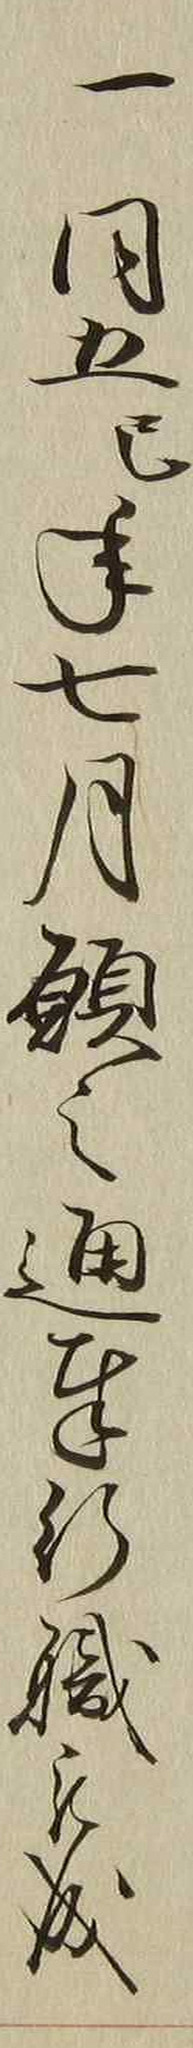一同五巳年七月願之通奉行職被成
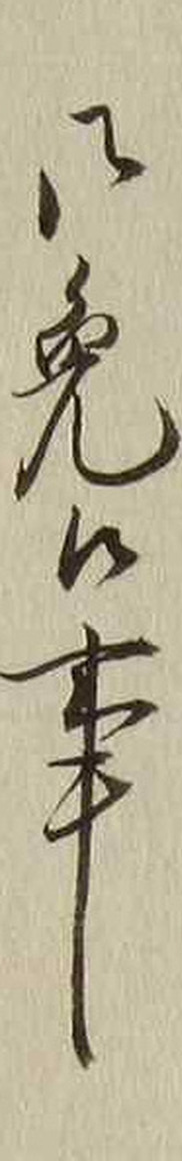御免候事
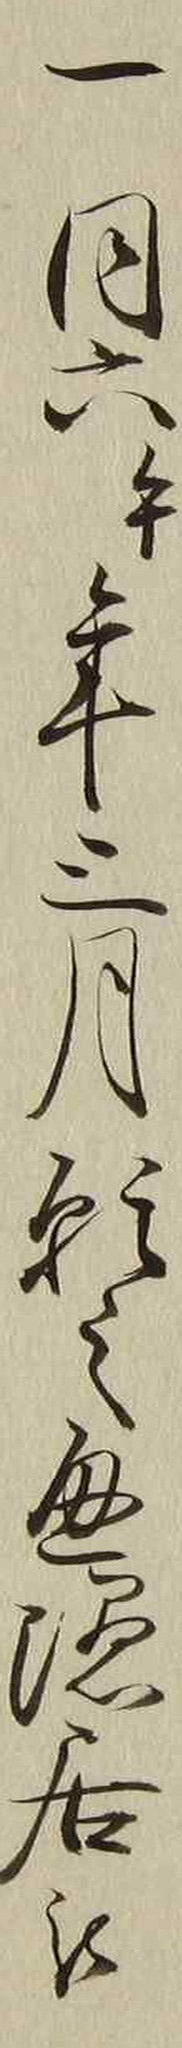一月六午年三月願之通隠居被
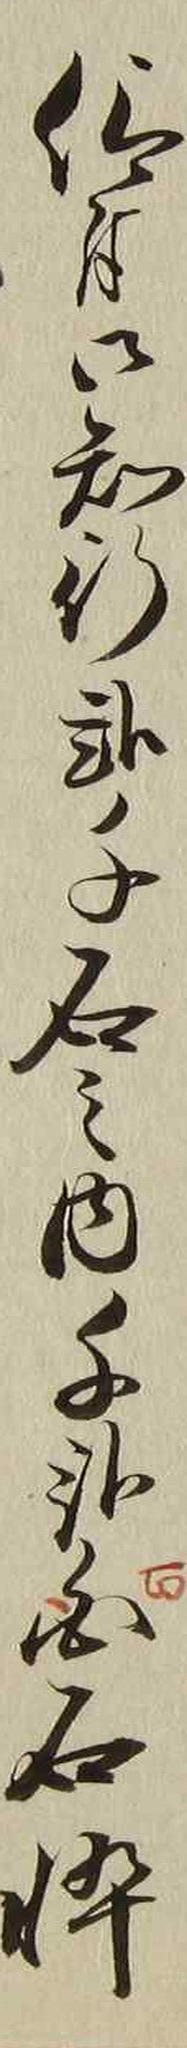仰付御知行弐千石之内千弐百石忰
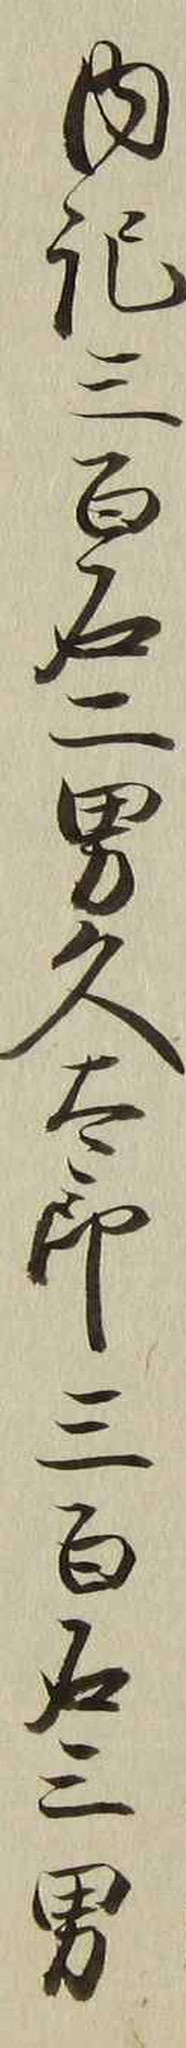内記三百石二男久太郎三百石三男
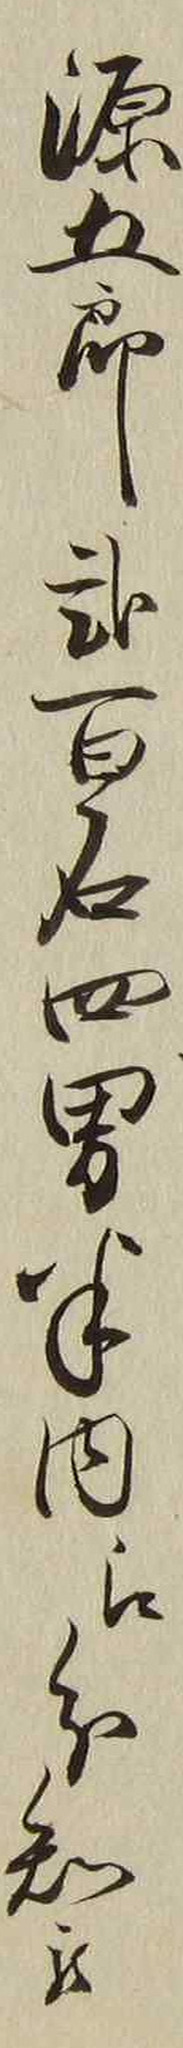源五郎弐百石四男半内江分知被
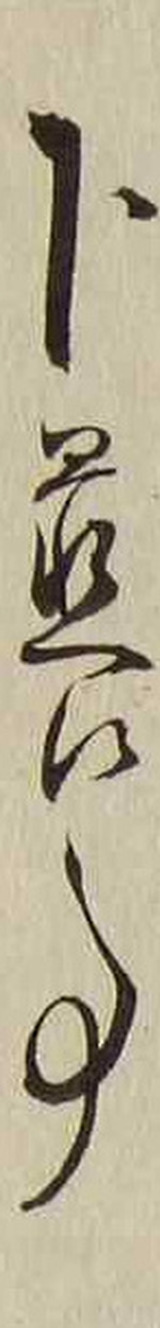下置候事
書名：諸士系譜　巻之77　を之部11
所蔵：会津若松市立会津図書館
